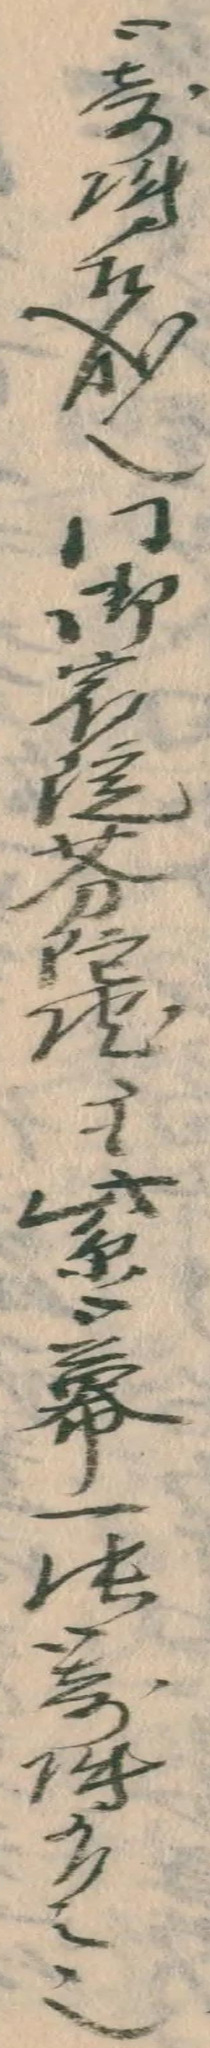御寄附相成也同御宿院芬陀院へも紫御幕一張御寄付有之也
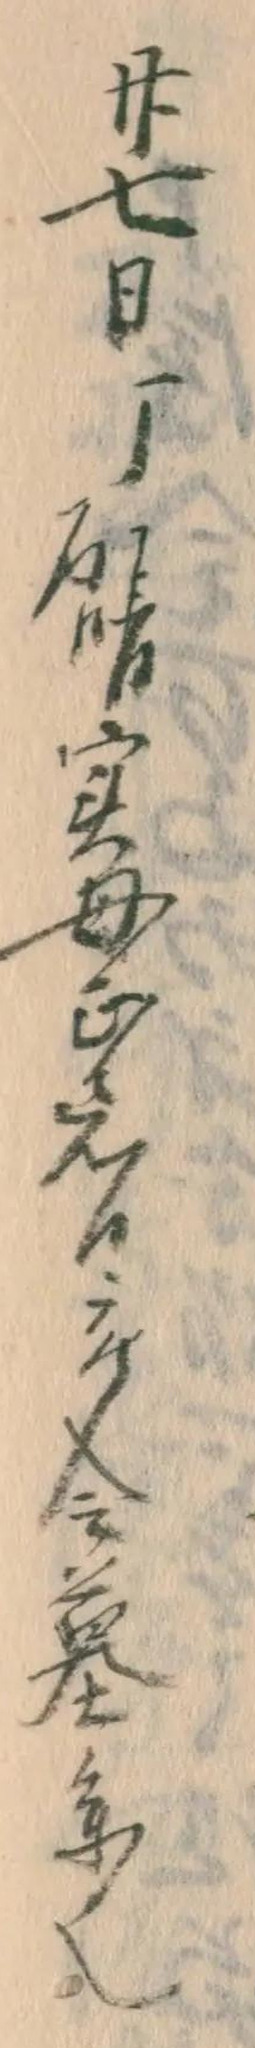廿七日丁酉晴實母正忌日ニ付令墓参也
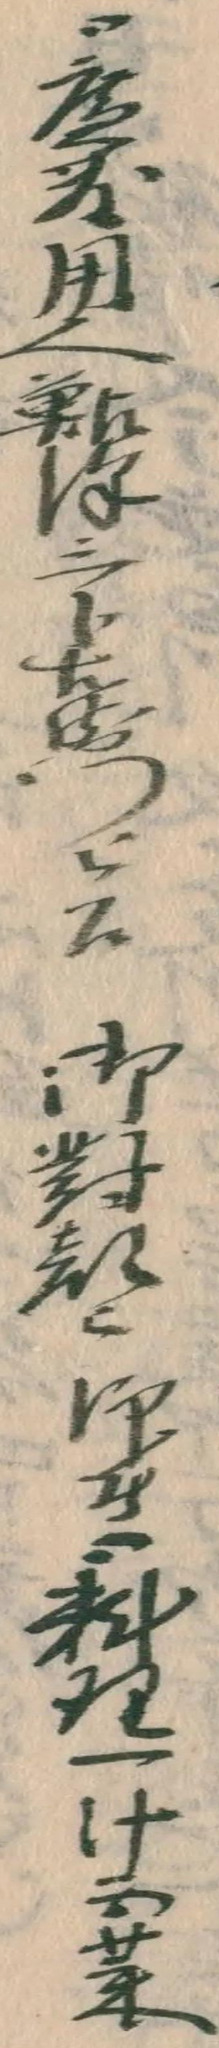御屋敷用人鮎津三郎右衛門被召御對顔被仰付候料理一汁五菜
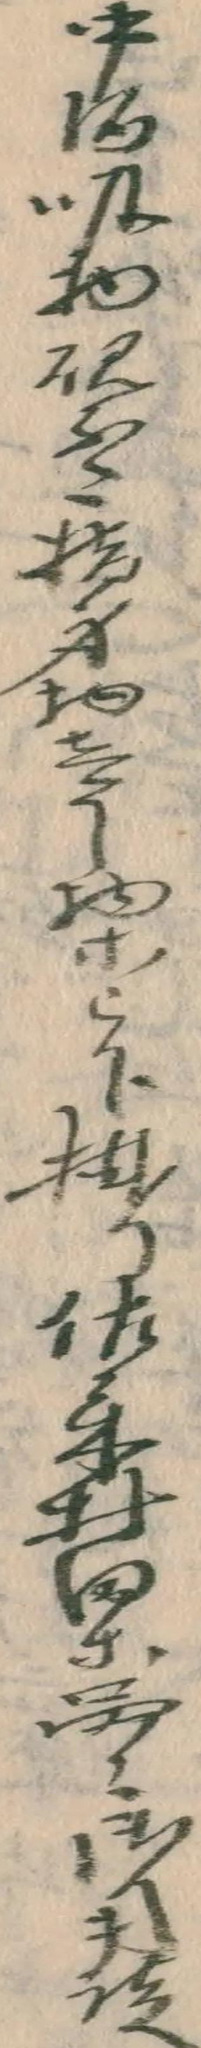中酒吸物硯ふた指身物ひたし物等被下掛り佐藤木村田等品々御用役
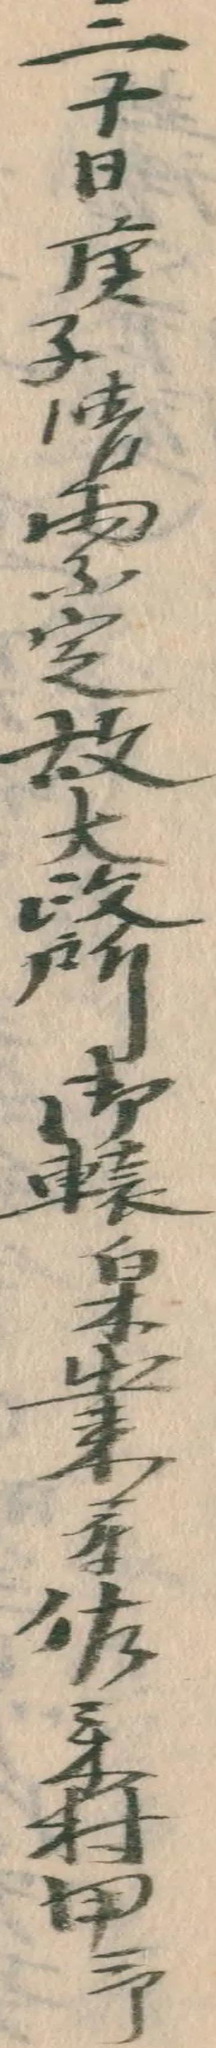三十日庚子晴雨不定故大政所御轅白木出来ニ付佐々木村田予
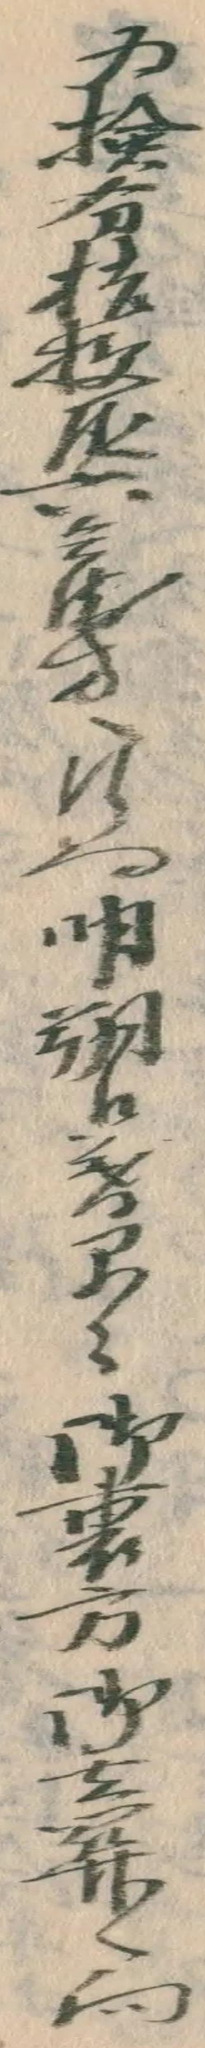為検分桔梗屋六兵衛方へ行向明朔日暮早々御裏方御玄関へ向
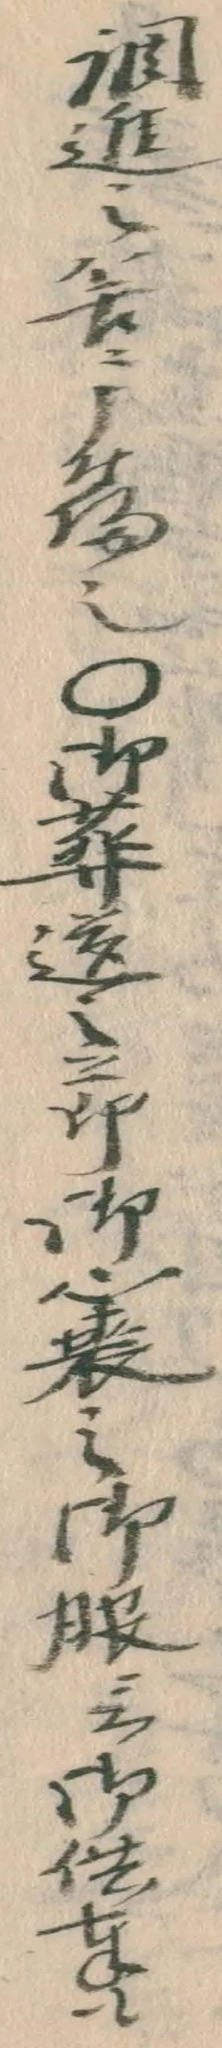調進之筈に申付帰也○御葬送之節御心喪之御服ニ而御供奉も
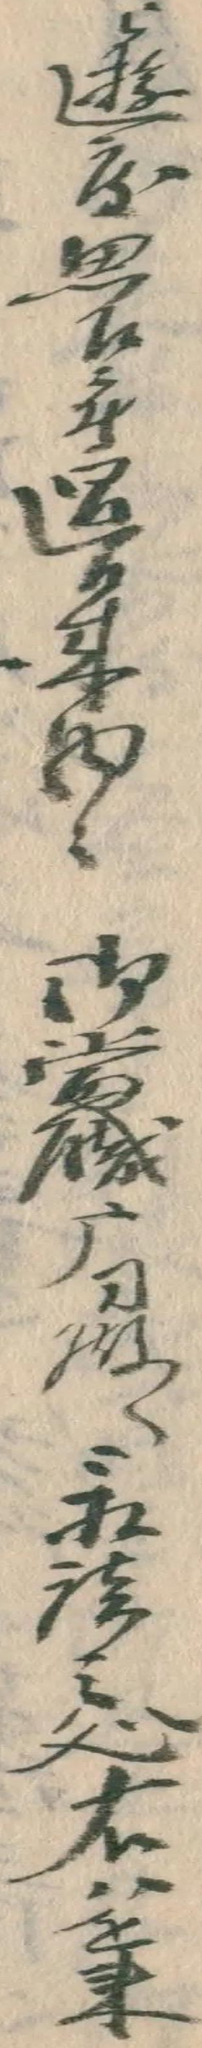被遊度思召ニ付過日来内々御当職鷹司殿へ御挨拶之処右は近来
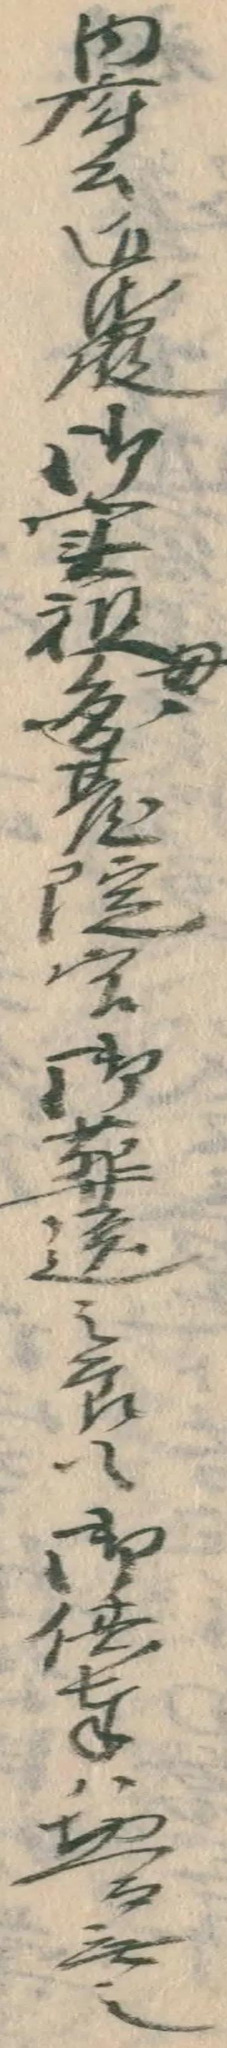内府公近衛殿御実祖母円台院守御葬送之節も御供奉ハ惣而無之
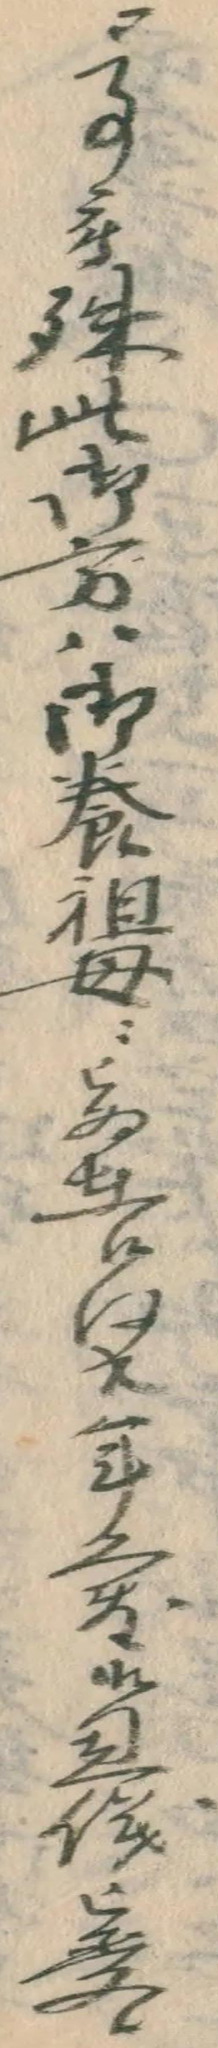御事ニ付殊此御方ハ御養祖母ニ被為在候得共年久敷御恩儀被受候
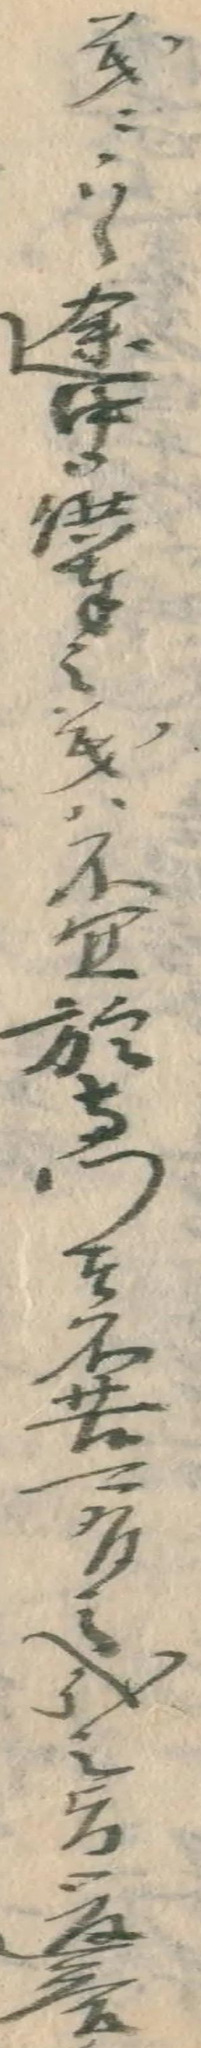義ニ候ハヽ途中御供奉之義ハ不宜於南門は不苦可有之哉之旨御返答也
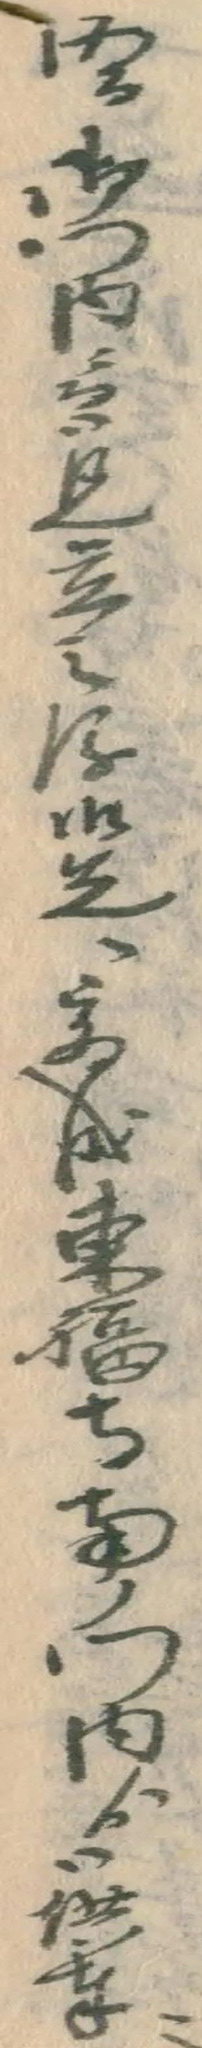仍而御門内に而御見立之後御先へ被為成東福寺南ノ門内ゟ御供奉

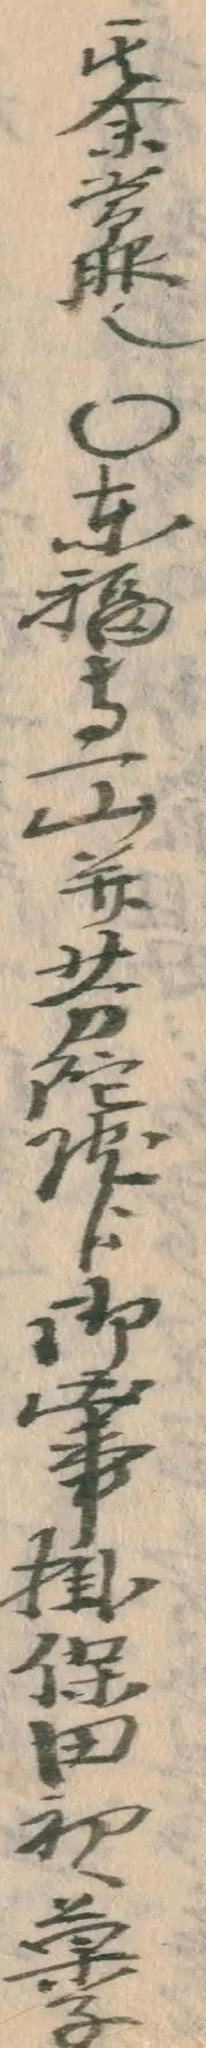其余常服也○東福寺一山并芬陀院ゟ御凶事掛保田初へ菓子
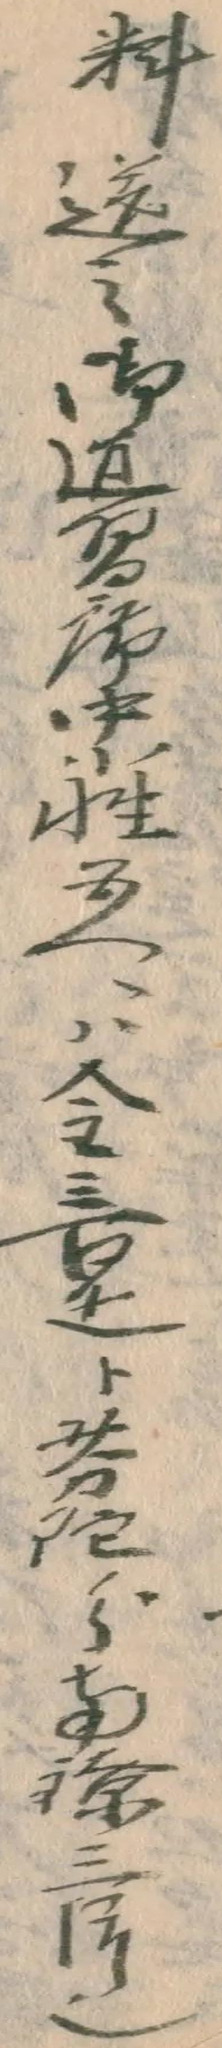料送之御近習席中小姓五人ヘハ金三百疋と芬陀分南鐐三片也
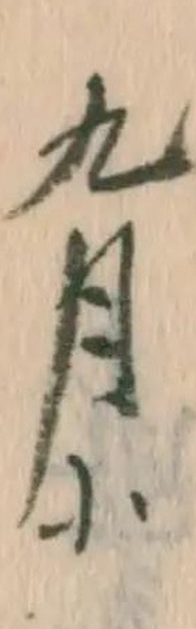九月小
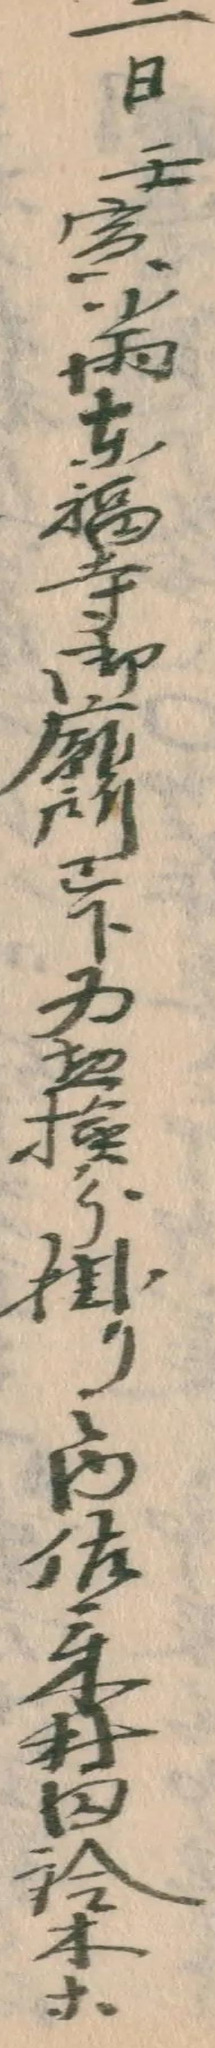二日壬寅小雨東福寺御廟所已下為惣検分掛り之内佐々木村田鈴木等
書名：賀茂社記録. 第69冊
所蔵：国立国会図書館 National Diet Library, JAPAN
